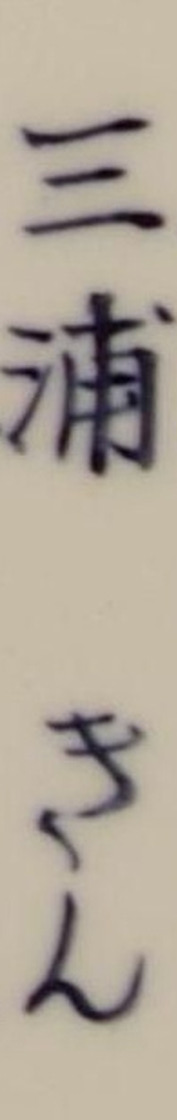三浦きん
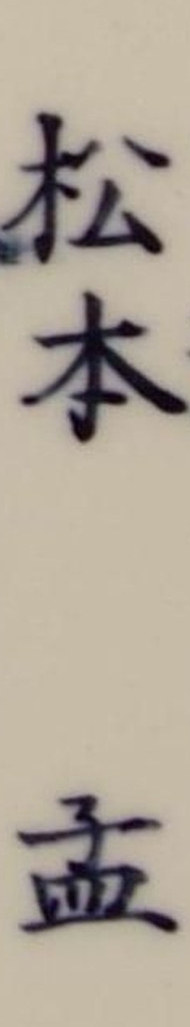松本孟
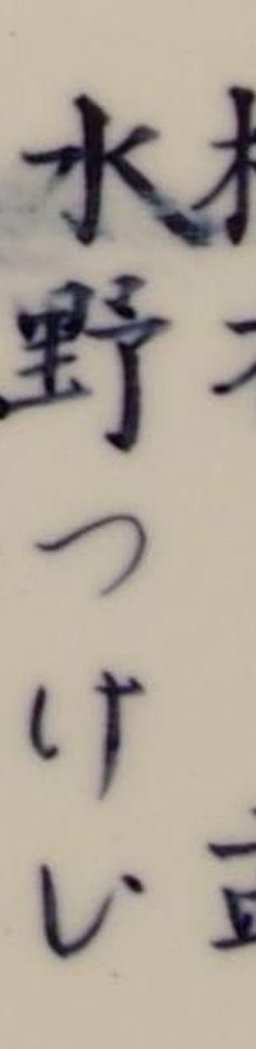水野つけい
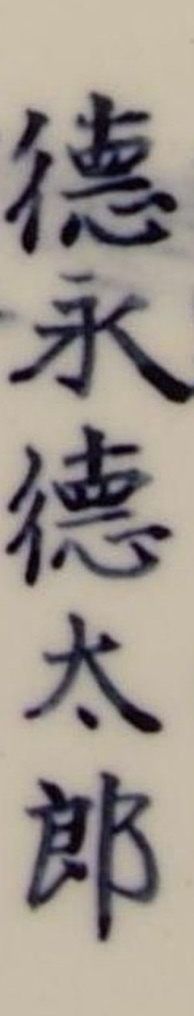徳永徳太郎
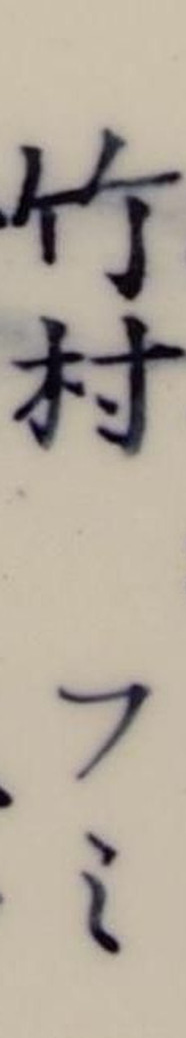竹村フミ
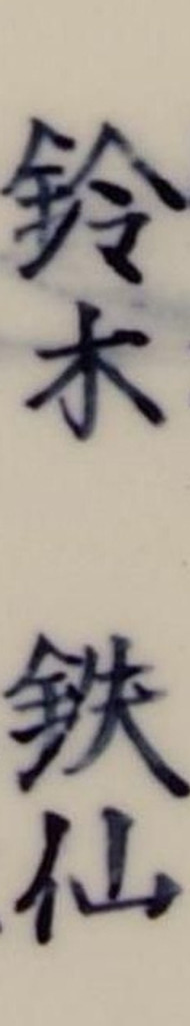鈴木鉄仙
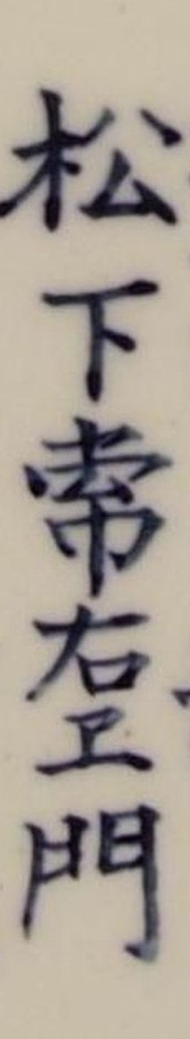松下常右ヱ門
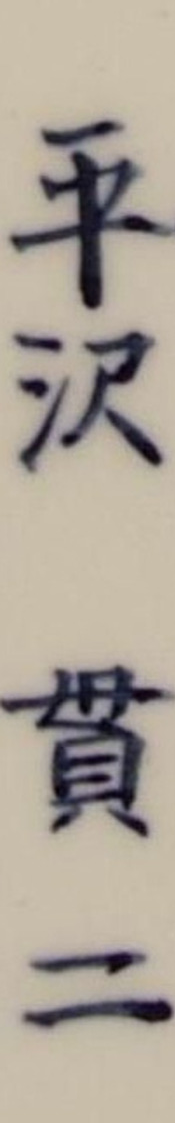平沢貫二
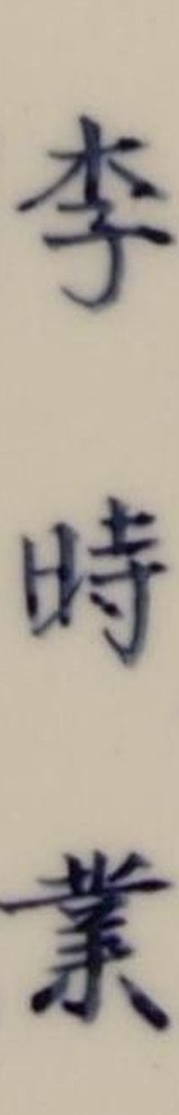李時業
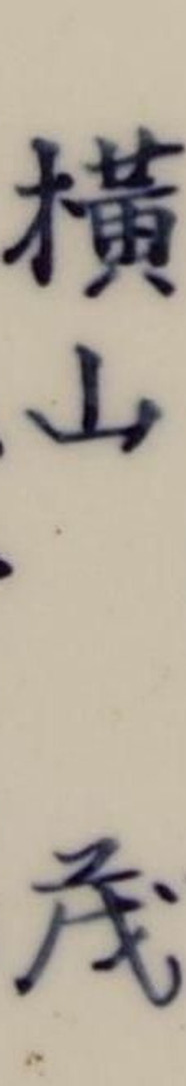横山茂
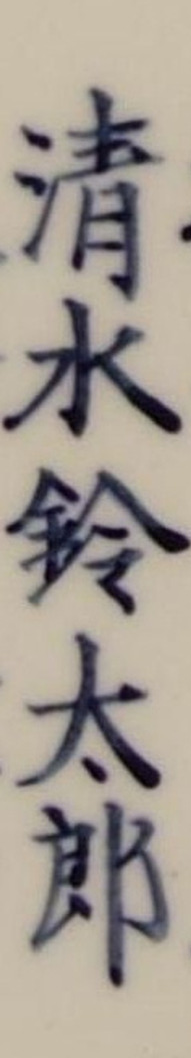清水鈴太郎
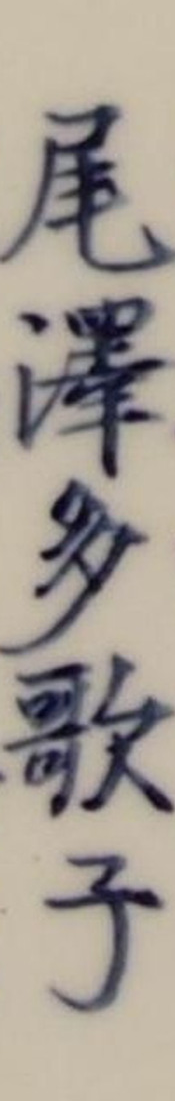尾澤多歌子
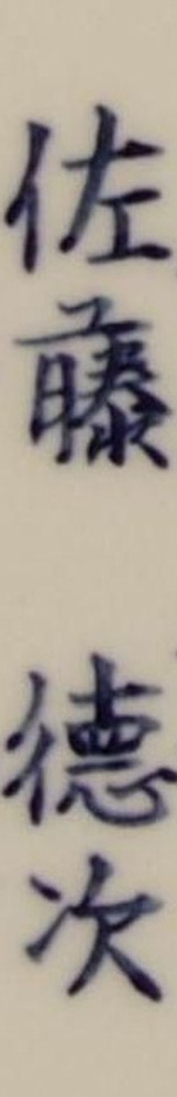佐藤徳次
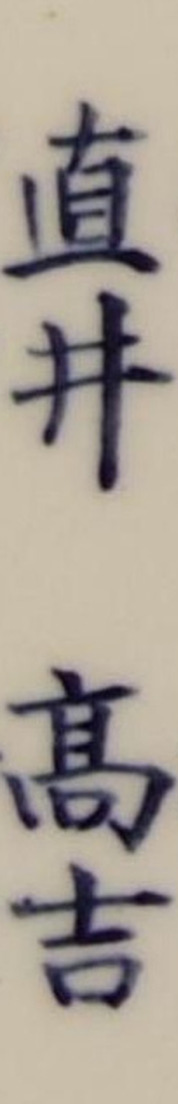直井高吉

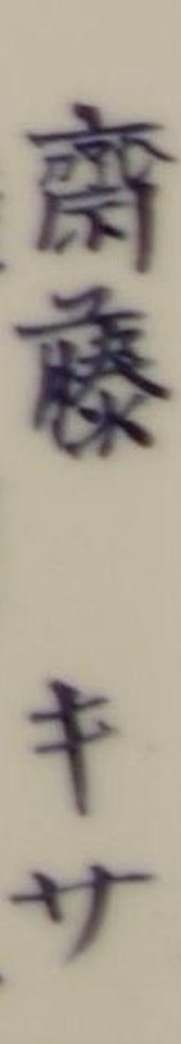斎藤キサ
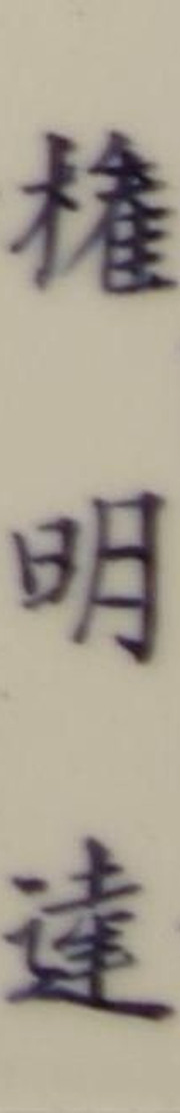権明達
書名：E~L
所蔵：高野山金剛峯寺
